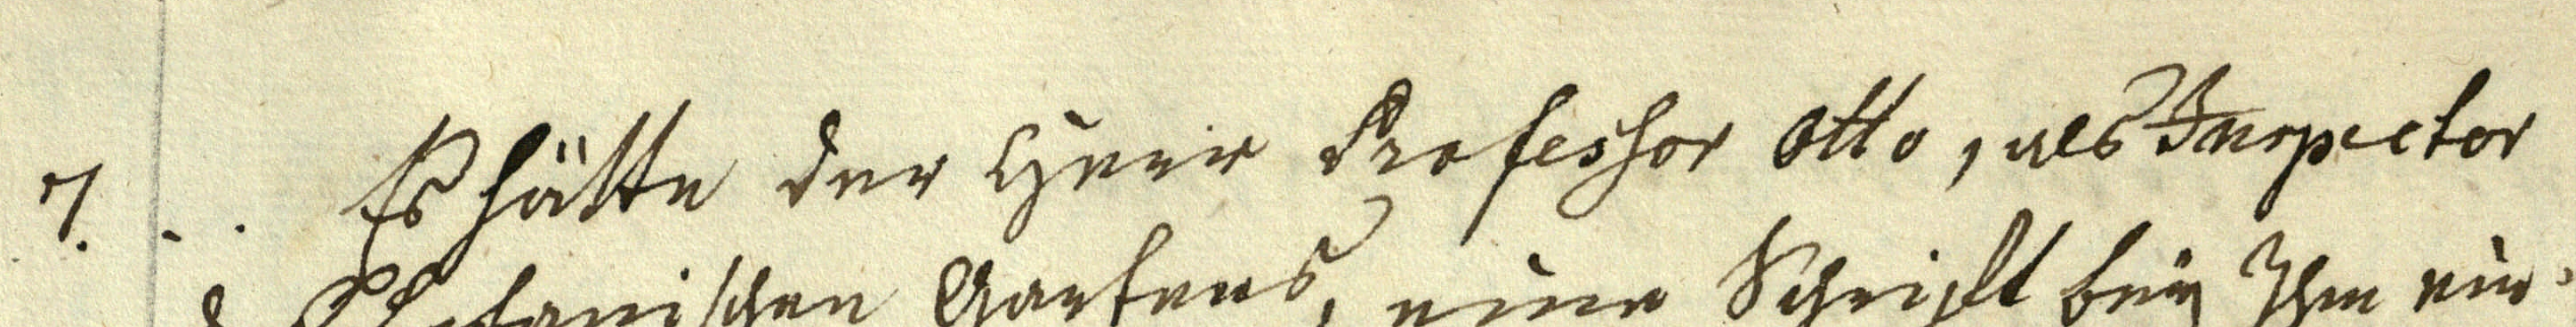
7. Es hätte der Herr Professor Otto, als Inspector
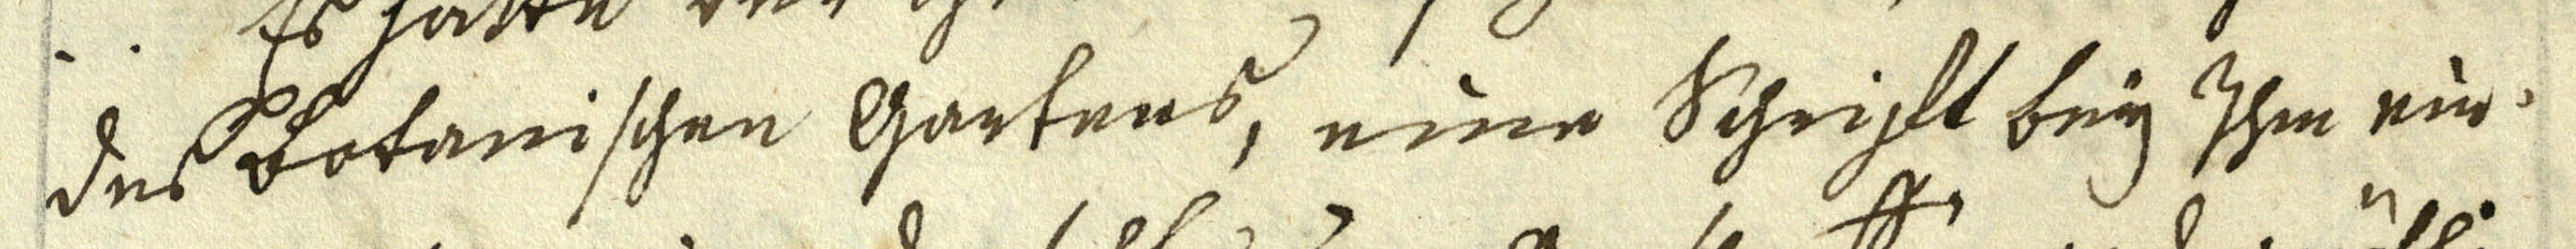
des Botanischen Gartens, eine Schrift beÿ Ihm ein¬
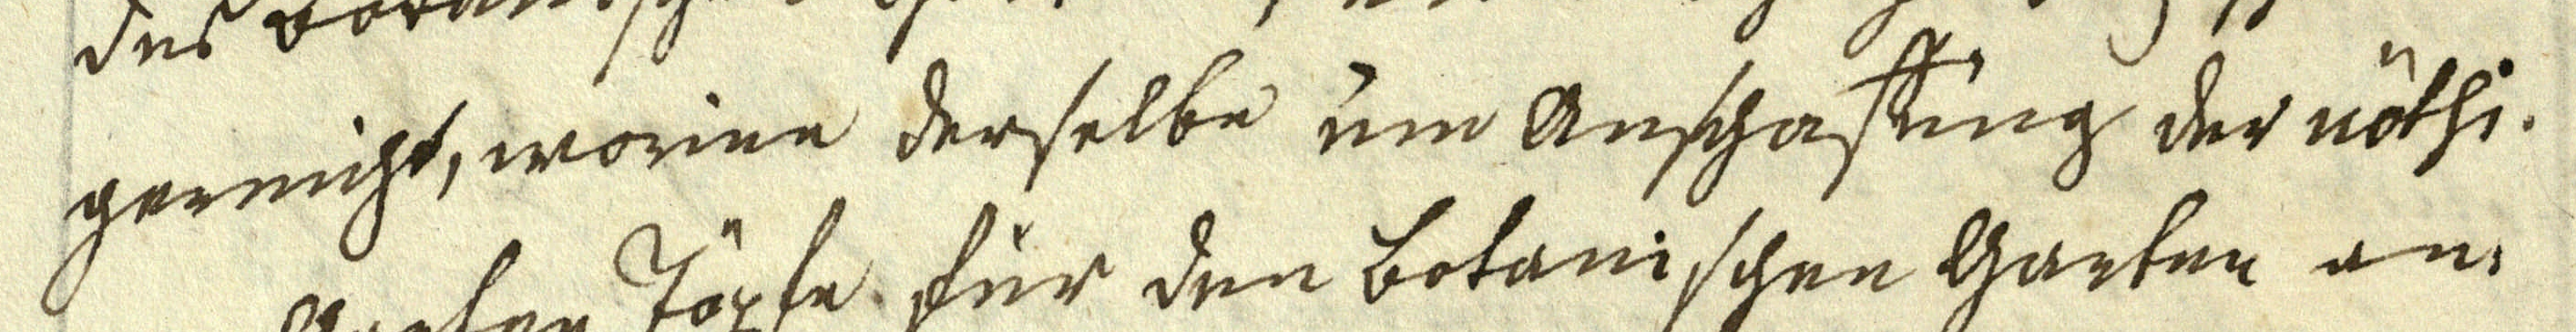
gereicht, worin derselbe um Anschaffung der nöthi¬
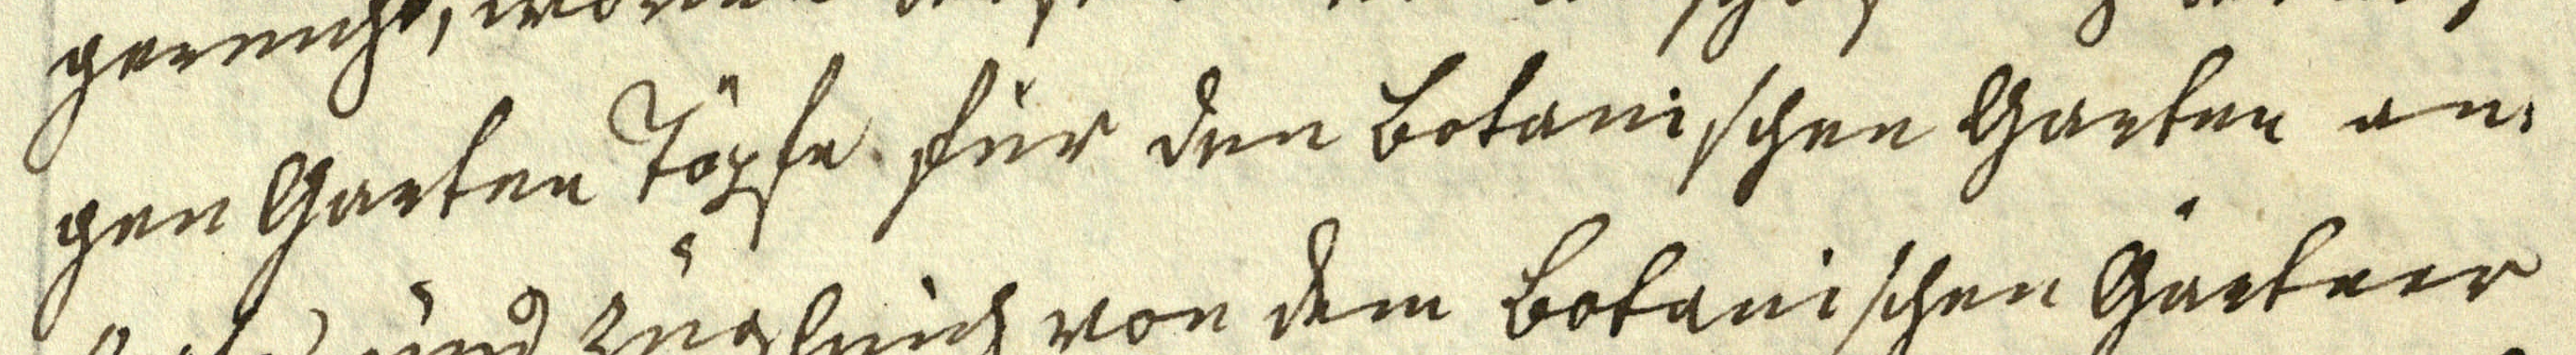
gen Garten Töpfe für den Botanischen Garten an¬
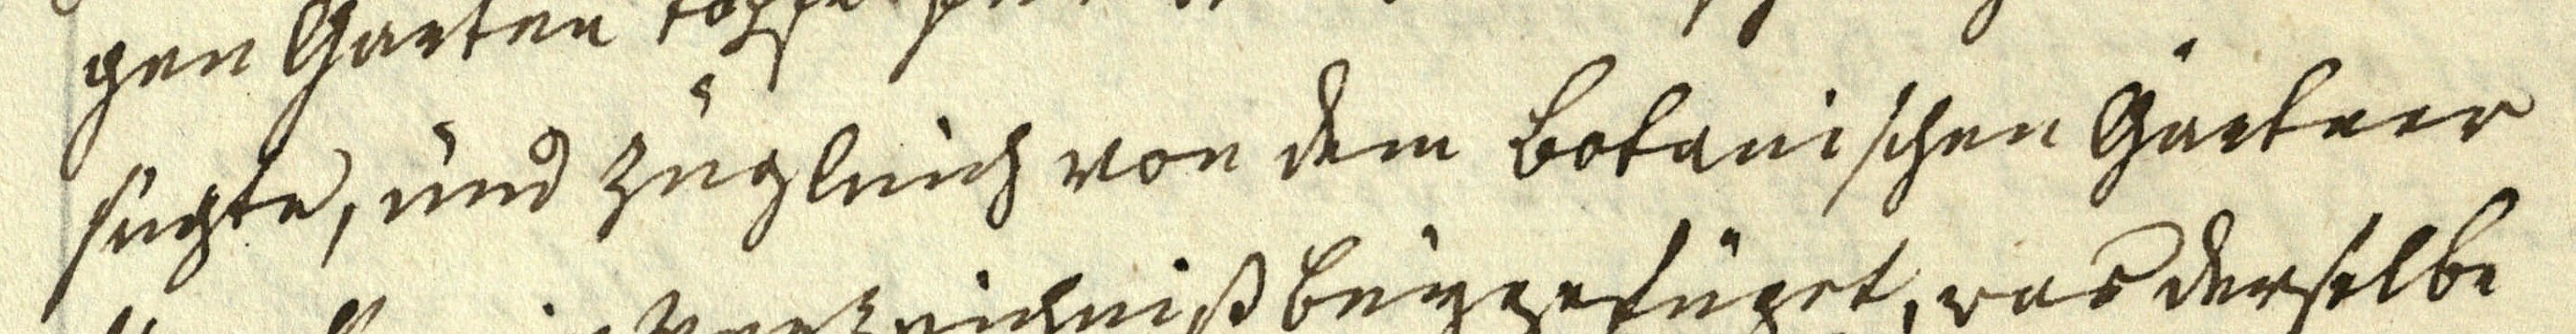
suchte, und zugleich von dem Botanischen Gärtner
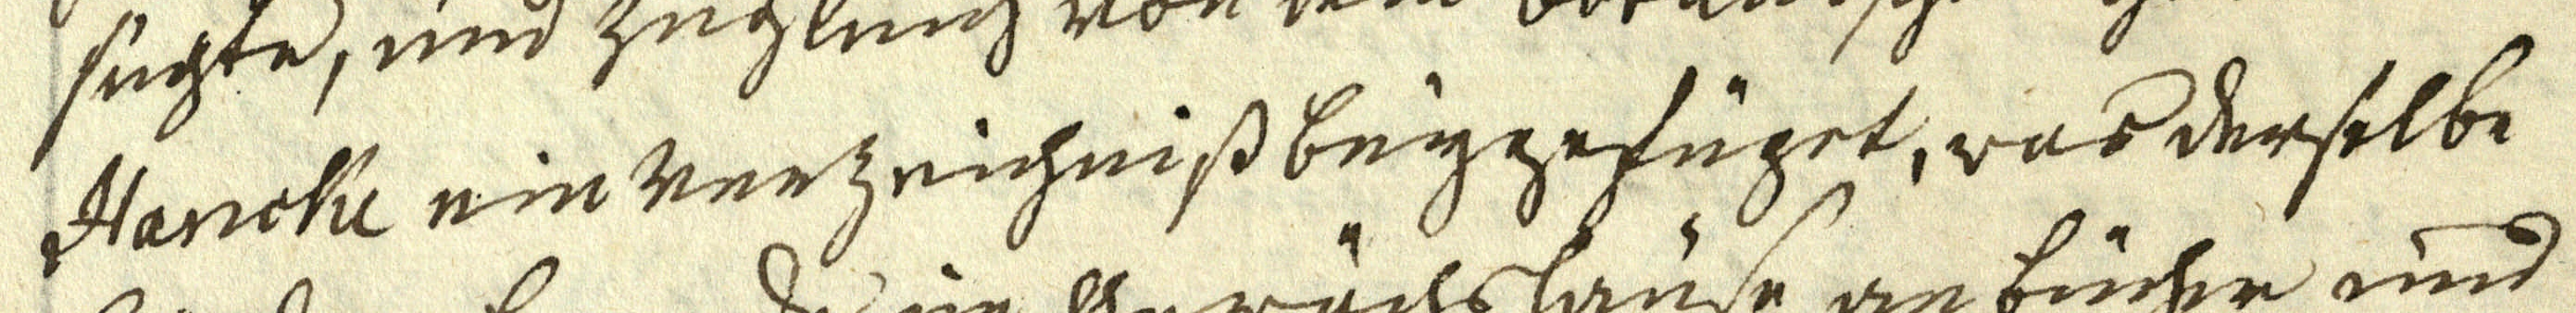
Hancke ein Verzeichniß beÿgefüget, was derselbe
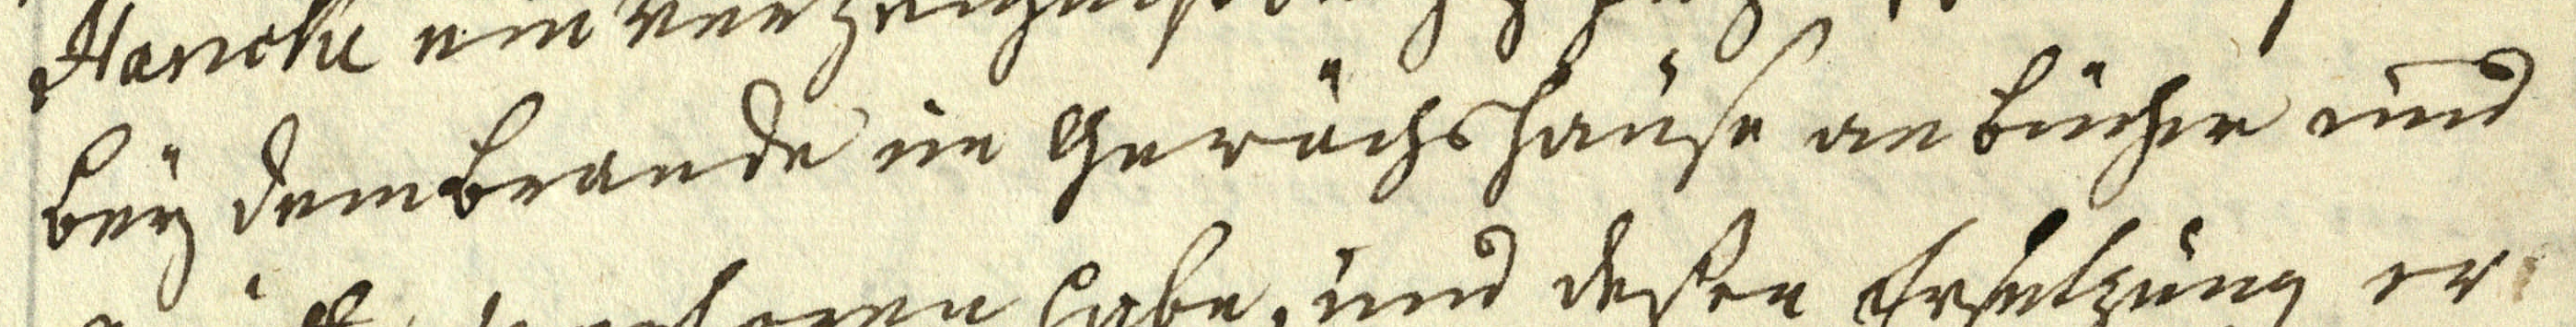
beÿ dem Brande in Gewächshause an Bücher und
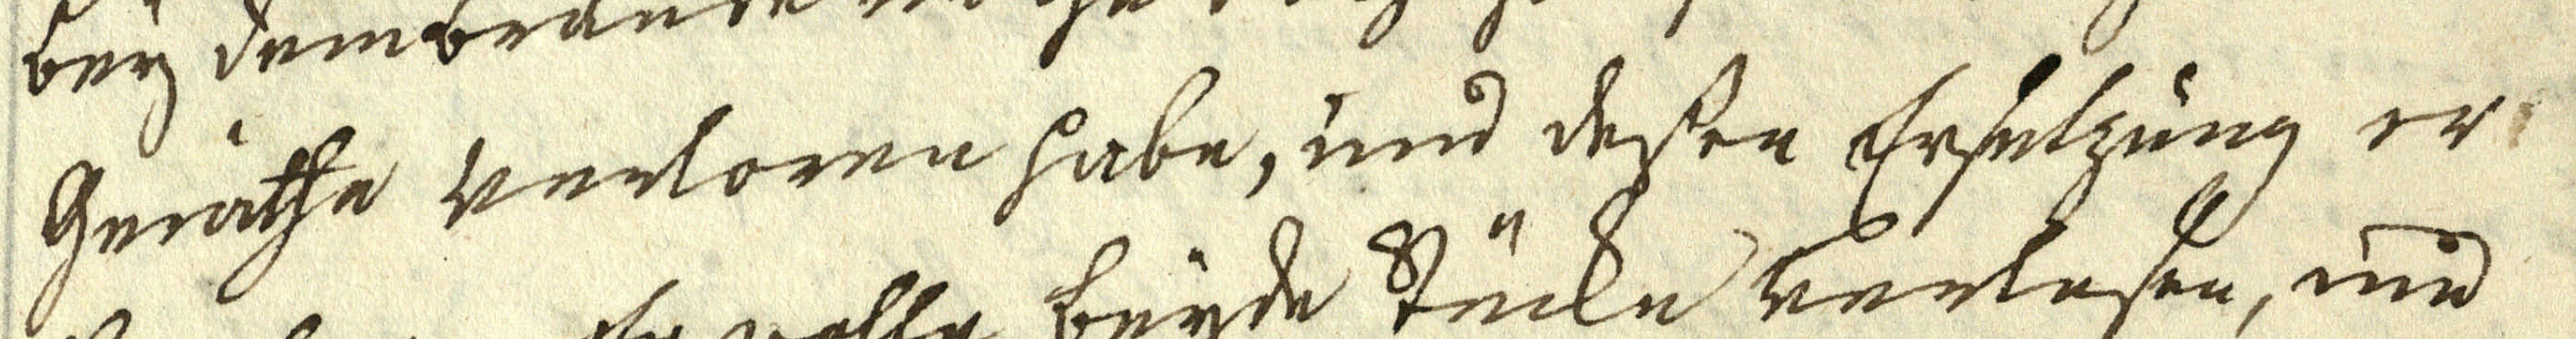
Geräthe verloren habe, und deßen Ersetzung er
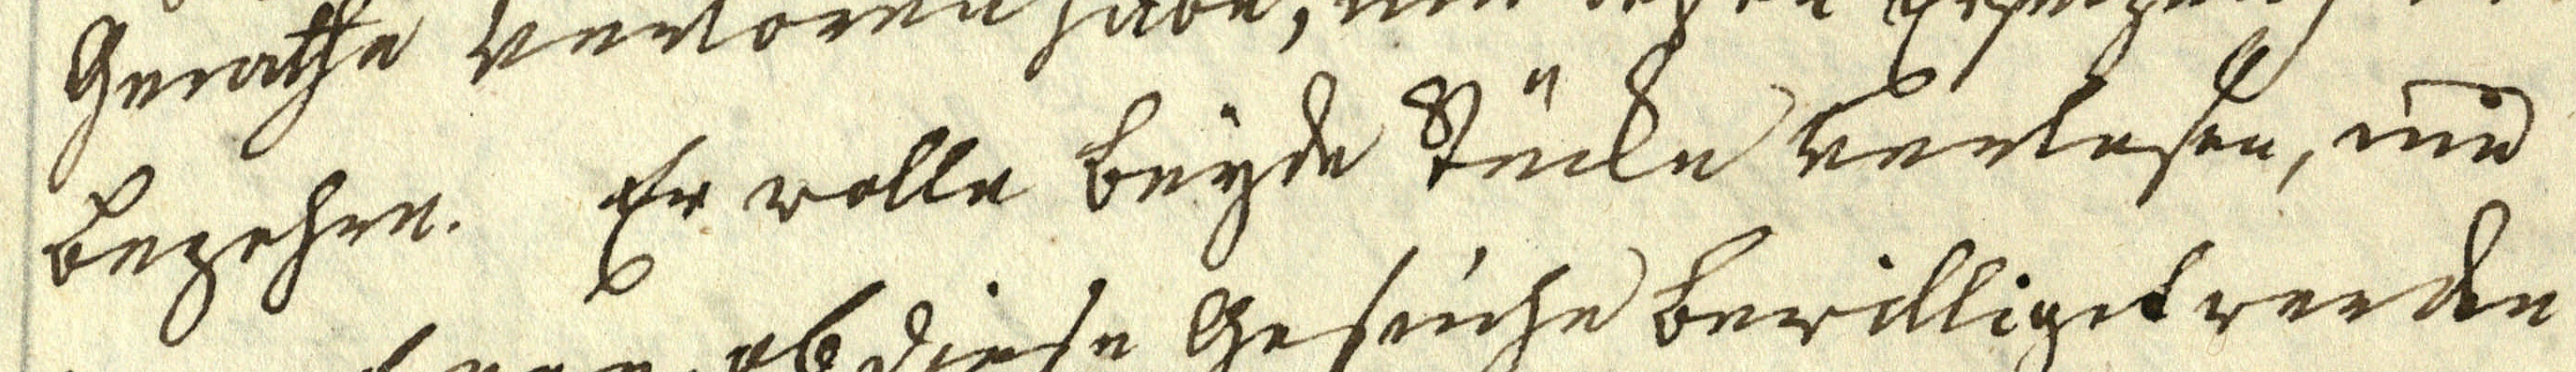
begehre. Er wolle beÿde Stücke verlesen, und
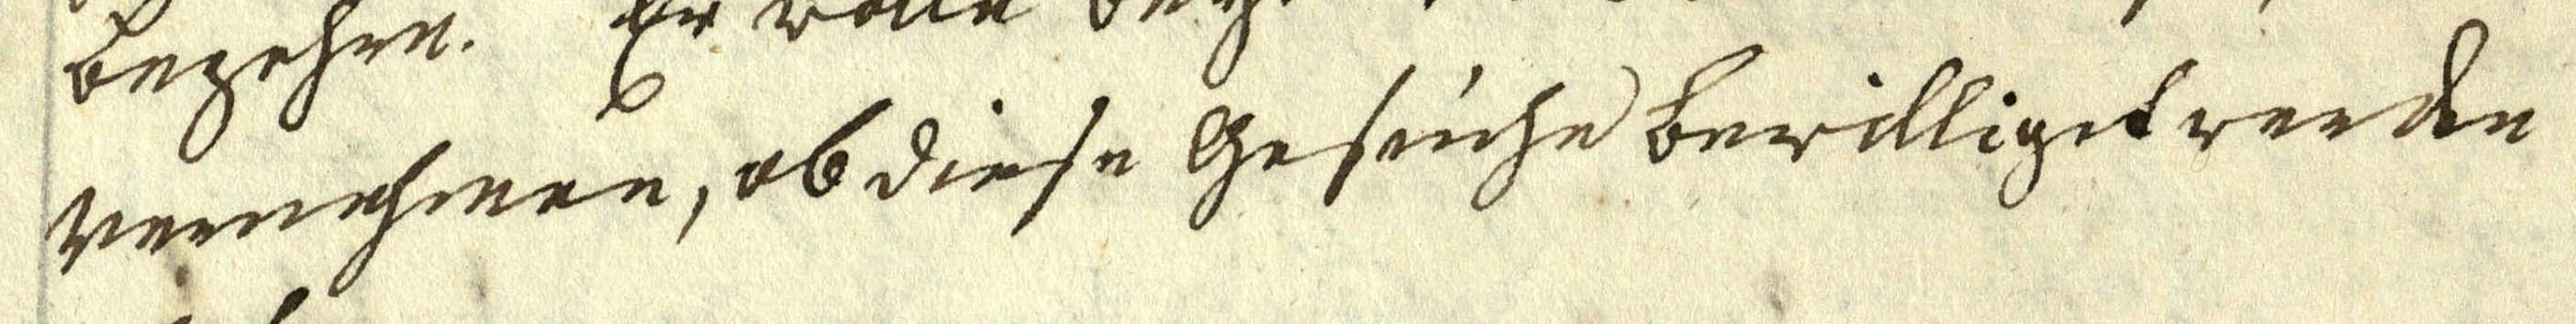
vernehmen, ob diese Gesuche bewilliget werden
